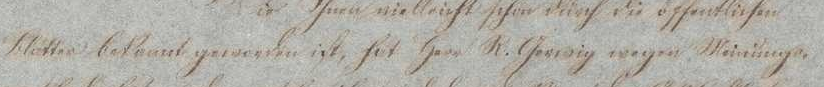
Blätter bekannt geworden ist, hat Herr R. Gerwig wegen Meinungs-
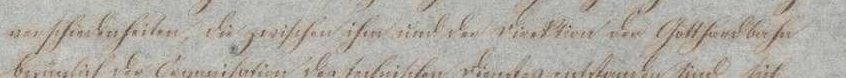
verschiedenheiten, die zwischen ihm und der Direktion der Gotthardbahn
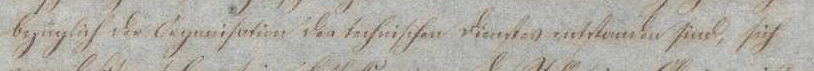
bezüglich der Organisation des technischen Dienstes entstanden sind, sich
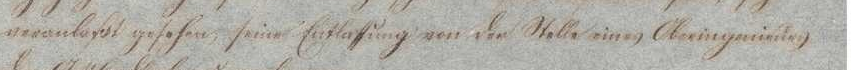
veranlaßt gesehen, seine Entlassung von der Stelle eines Oberingenieurs
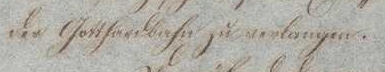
der Gotthardbahn zu verlangen.
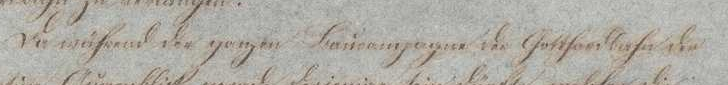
Da während der ganzen Baucampagne der Gotthardbahn der
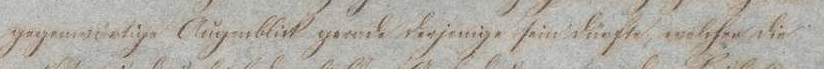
gegenwärtige Augenblick gerade derjenige sein dürfte, welcher die
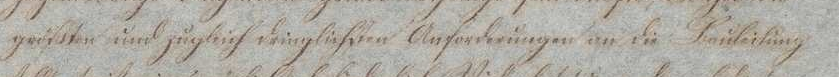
größten und zugleich dringlichsten Anforderungen an die Bauleitung
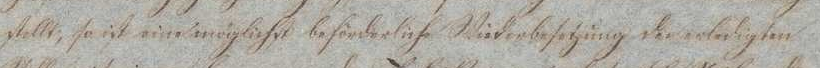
stellt, so ist eine möglichst beförderliche Wiederbesetzung der erledigten
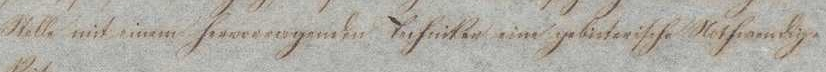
Stelle mit einem hervorragenden Techniker eine gebieterische Nothwendig-
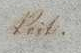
keit.
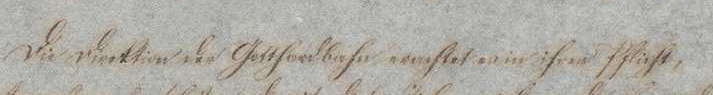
Die Direktion der Gotthardbahn erachtet es in ihrer Pflicht,
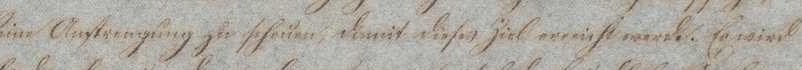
keine Anstrengung zu scheuen, damit dieses Ziel erreicht werde. Es wird
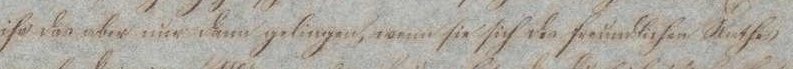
ihr das aber nur dann gelingen, wenn sie sich des freundlichen Rathes
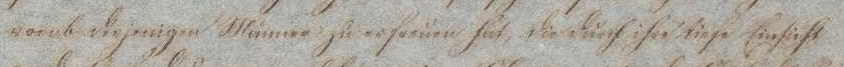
vorab derjenigen Männer zu erfreuen hat, die durch ihre tiefe Einsicht
